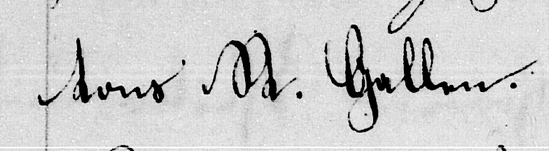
tons St. Gallen.
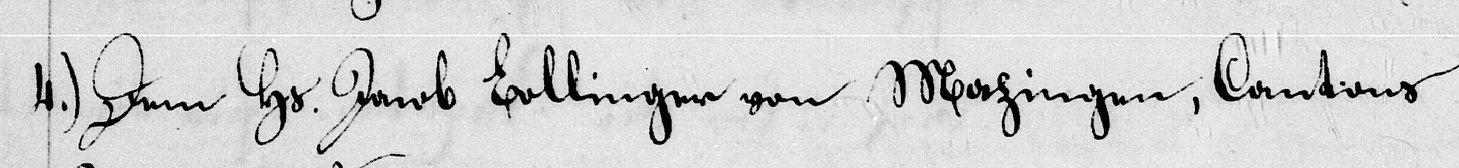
4.) Dem Hs. Jacob Bollinger von Mazingen, Cantons
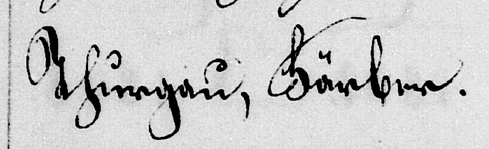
Thurgau, Färber.
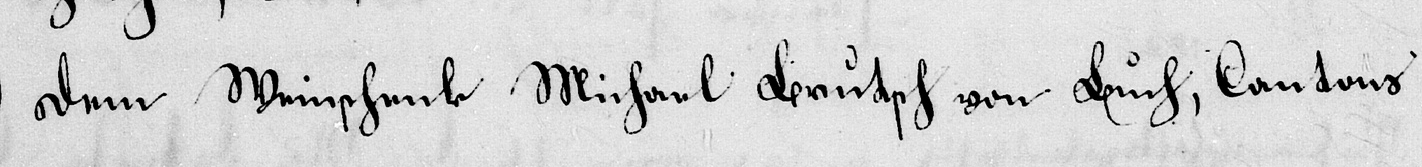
Dem Weinschenk Michael Brutsch von Buch, Cantons
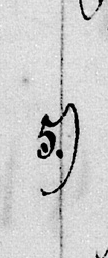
5.)
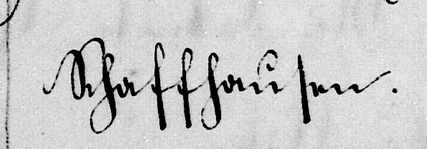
Schaffhausen.
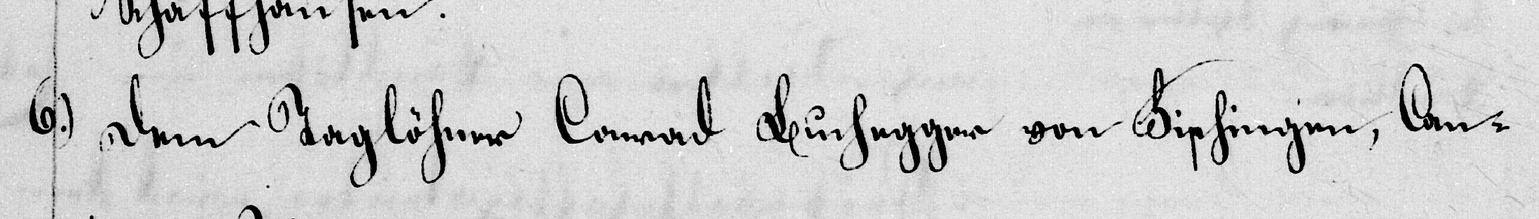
6.) Dem Taglöhner Conrad Buchegger von Fischingen, Can¬
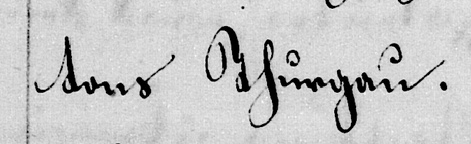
tons Thurgau.
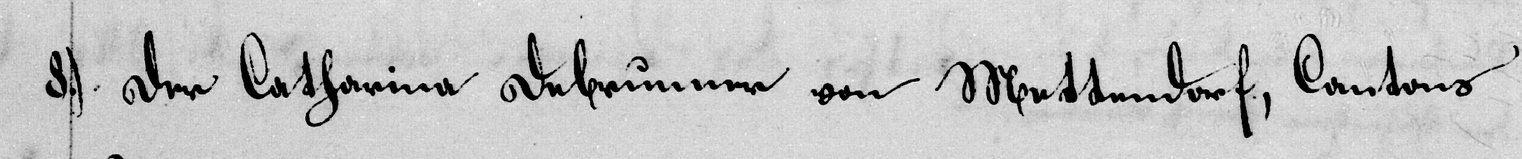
8.) Der Catharina Debrunner von Mettendorf, Cantons
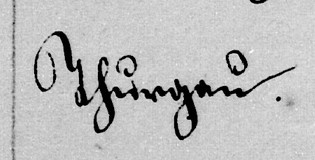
Thurgau.
